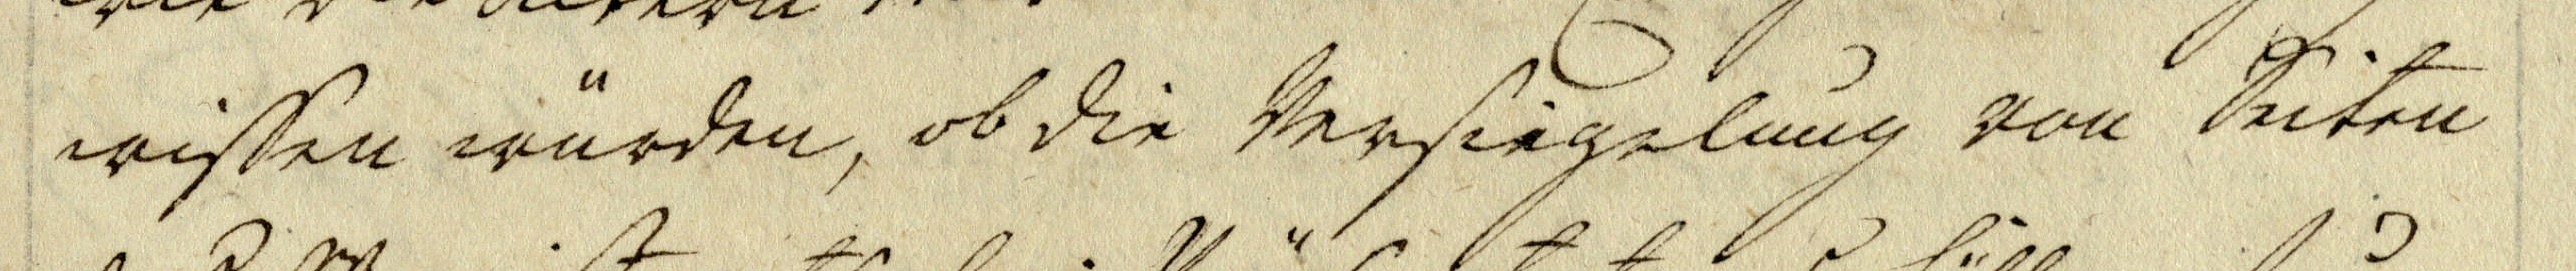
wissen würden, ob die Versiegelung von Seiten
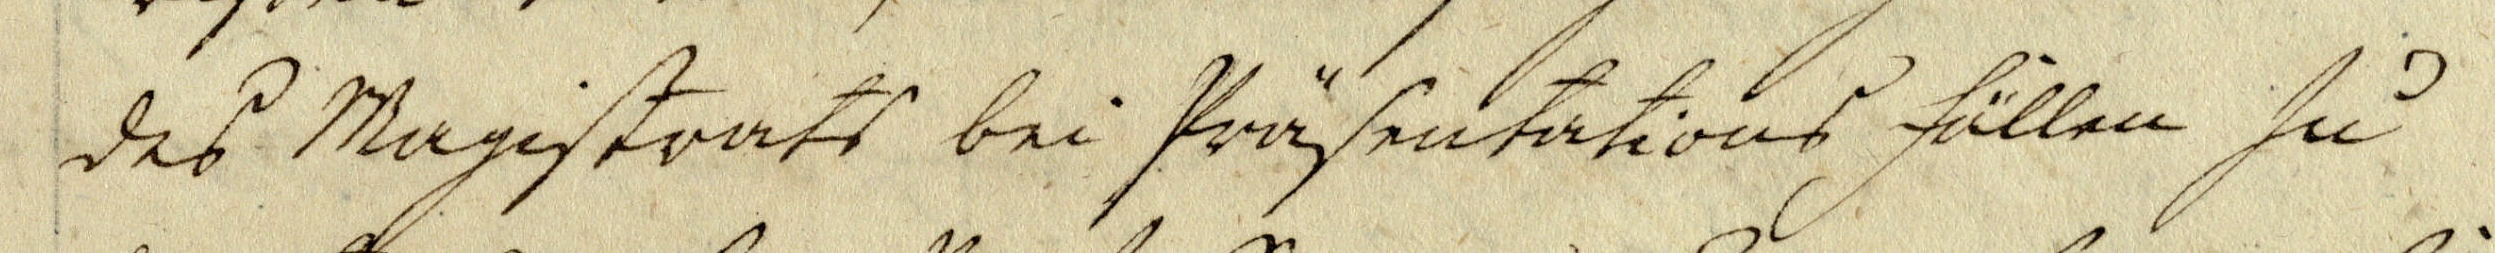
des Magistrats bei Präsentations Fällen zu
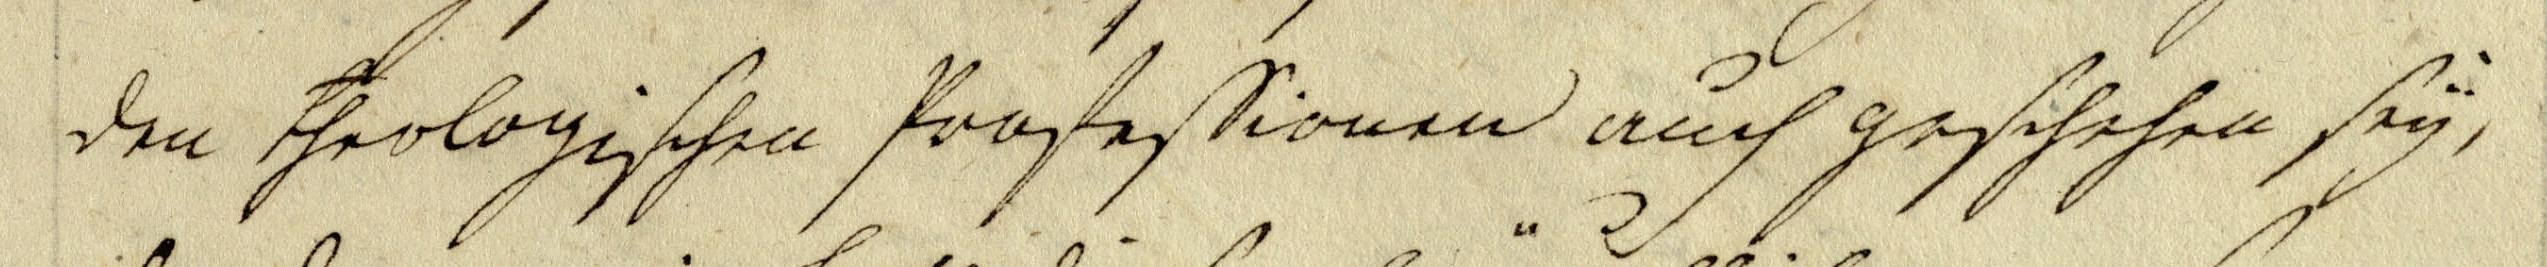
den Theologischen Professionen auch geschehen seÿ,
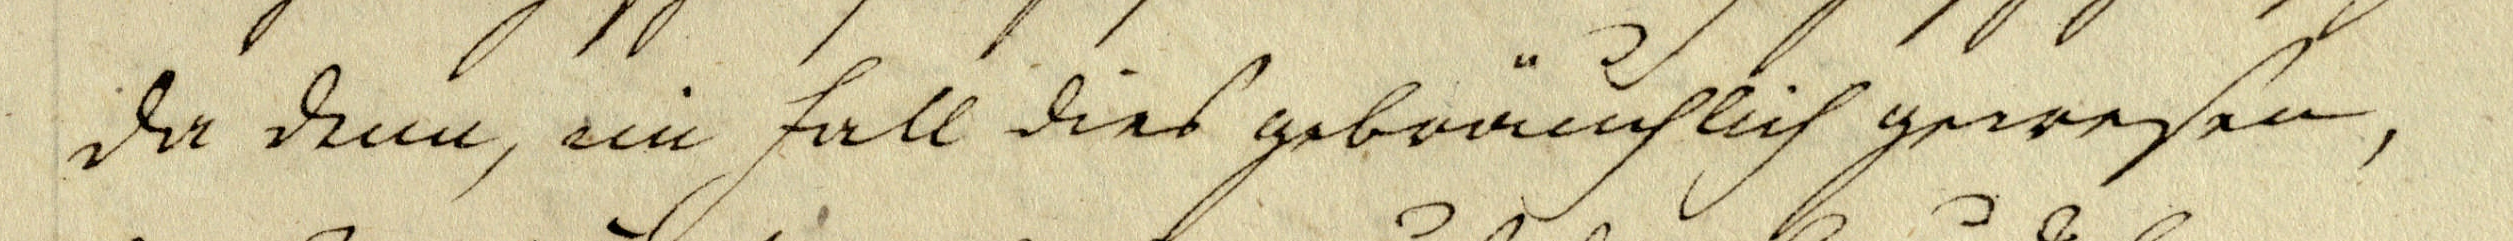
da denn, im Fall dies gebräuchlich gewesen,
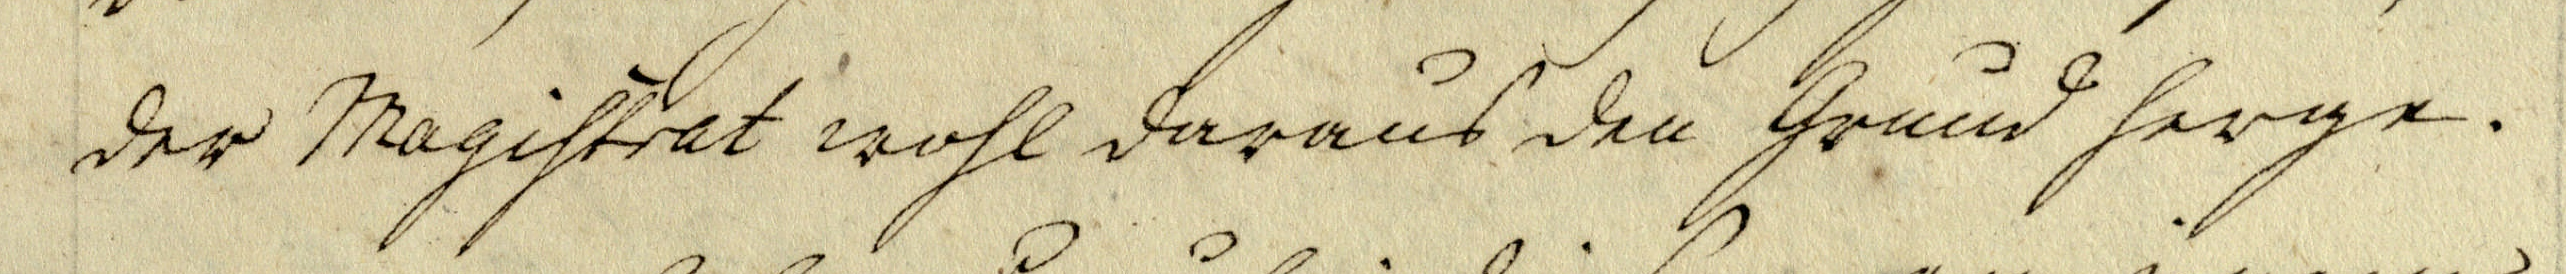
der Magistrat wohl daraus den Grund herge¬
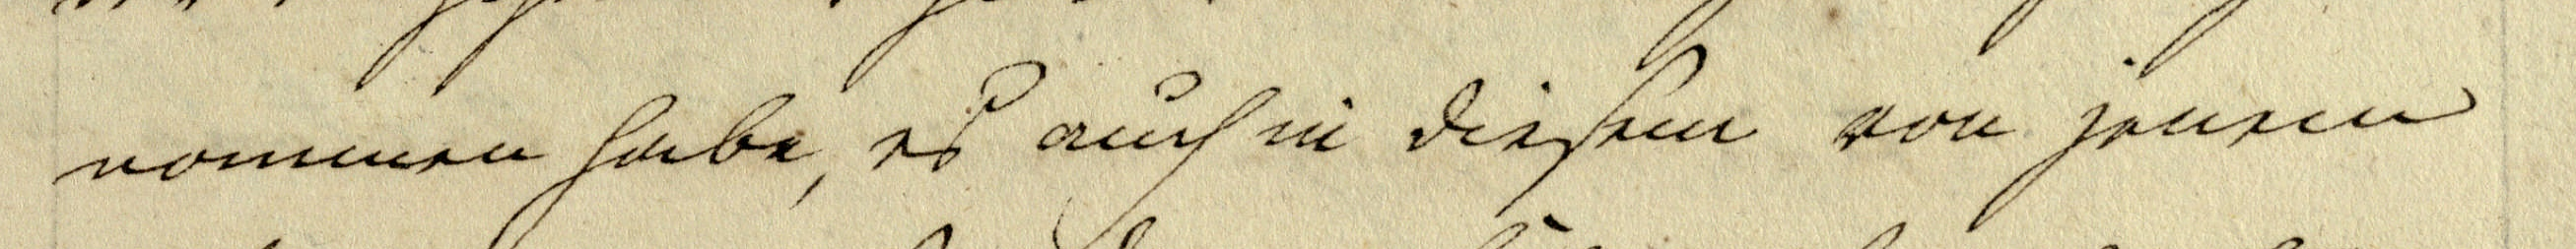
nommen habe, es auch in diesem von jenem
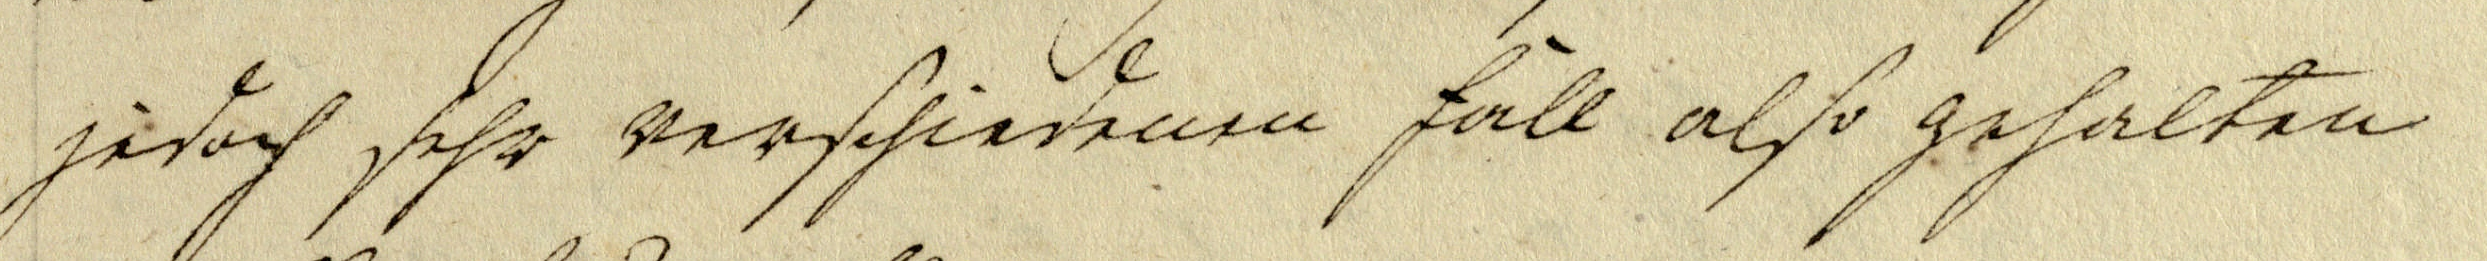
jedoch sehr verschiedenen Fall also gehalten
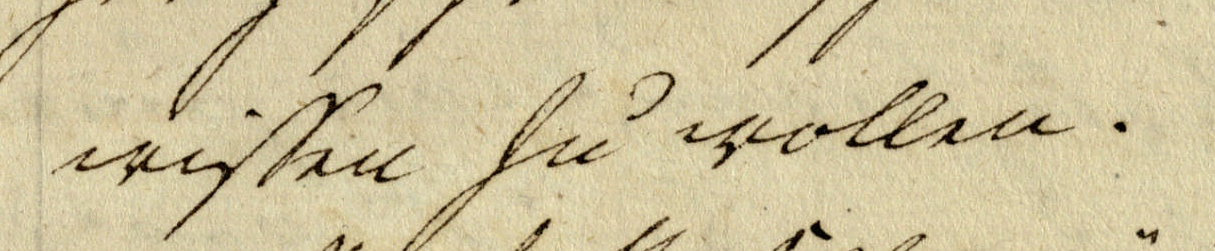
wissen zu wollen.
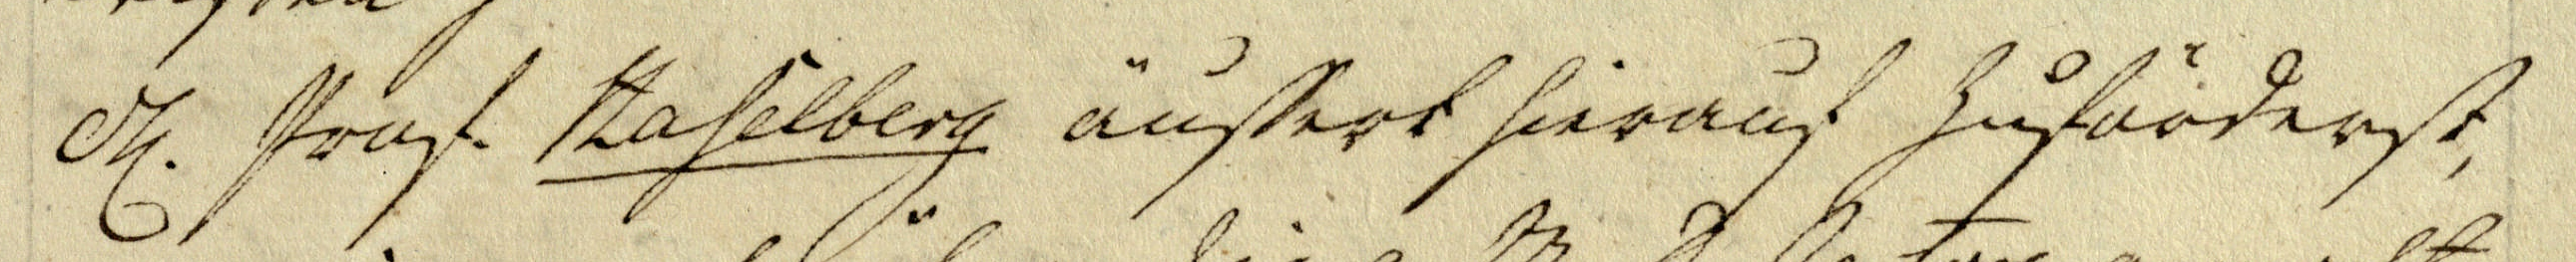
dh. Prof. Haselberg äussert hierauf zuförderst,
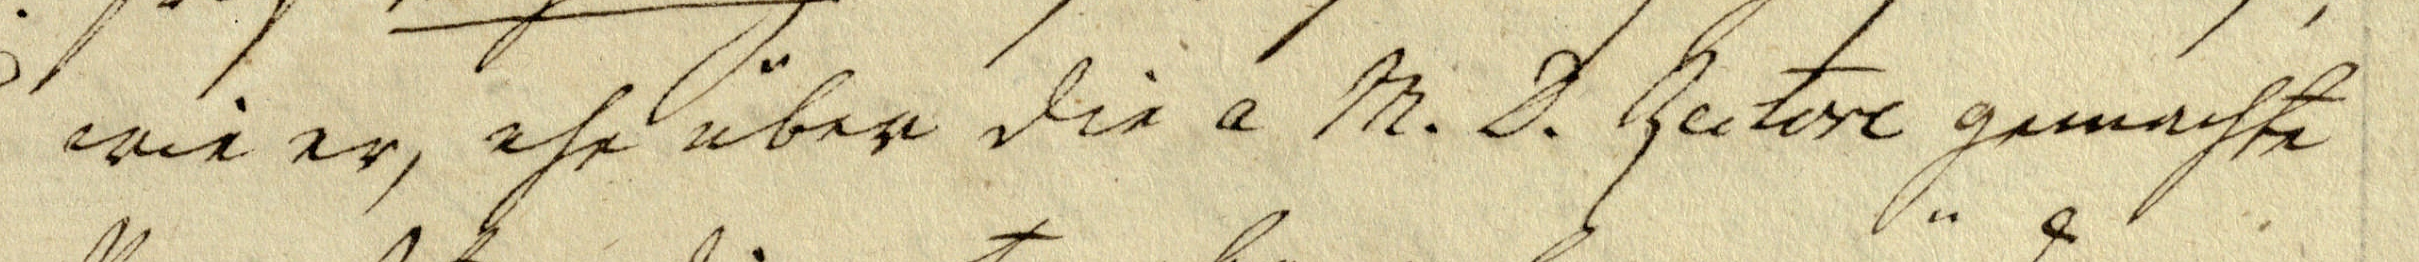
wie er, ehe über die a M. D. Rectore gemachte
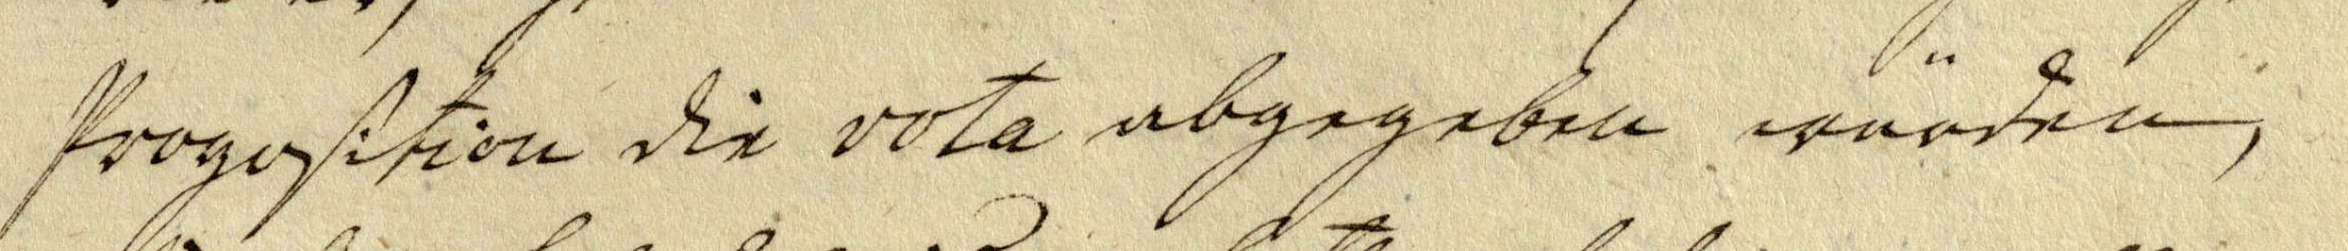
Proposition die vota abgegeben würden,
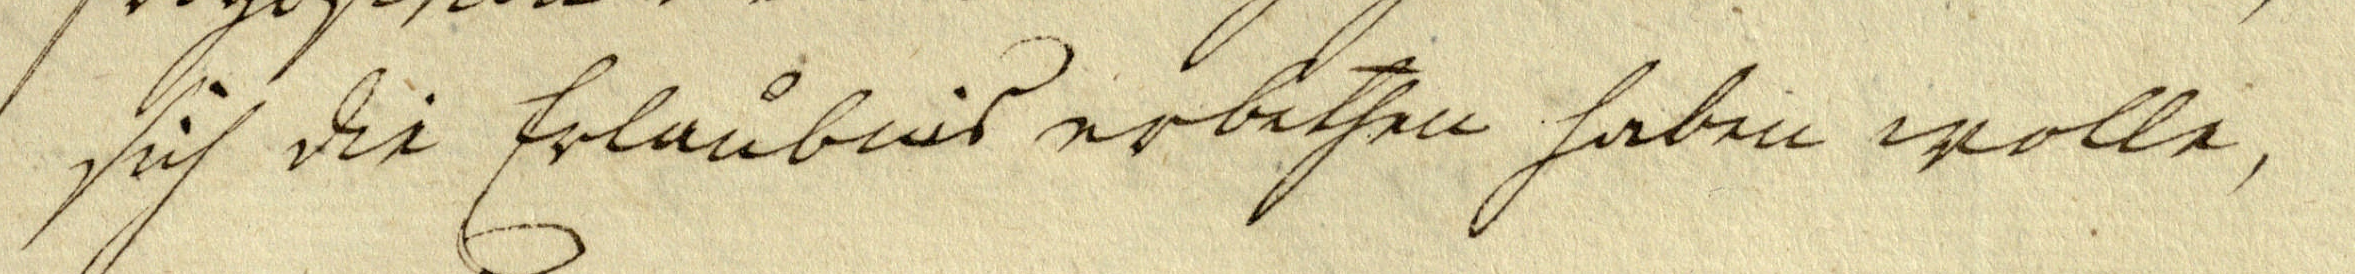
sich die Erlaubnis erbethen haben wolle,
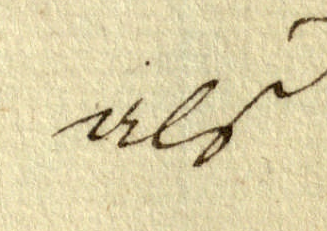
als
